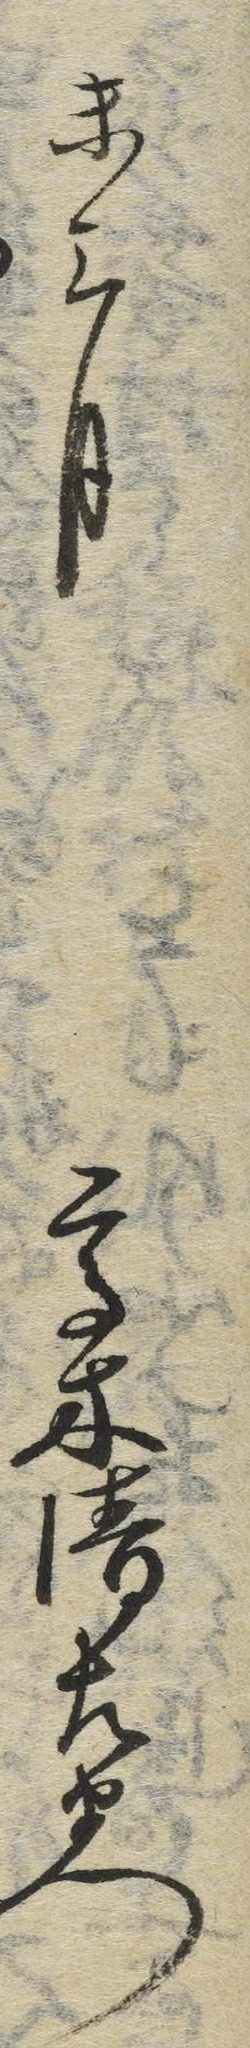未三月高木清左衛門
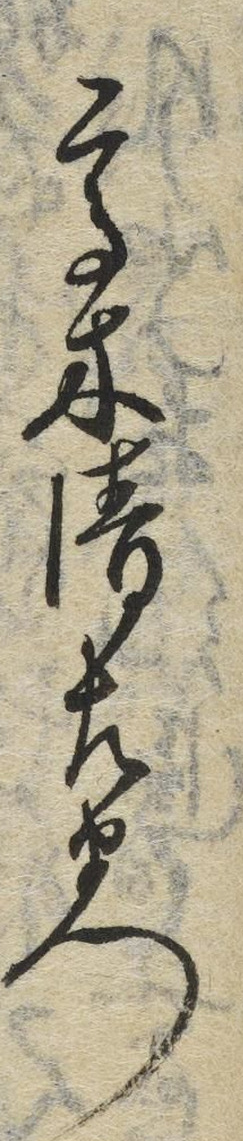高木清左衛門
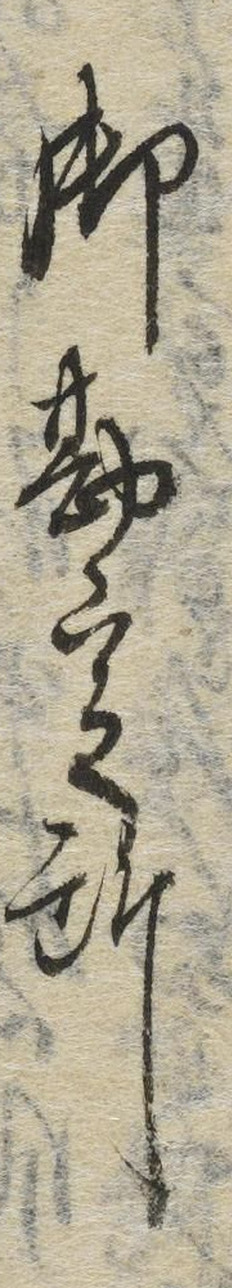御勘定所
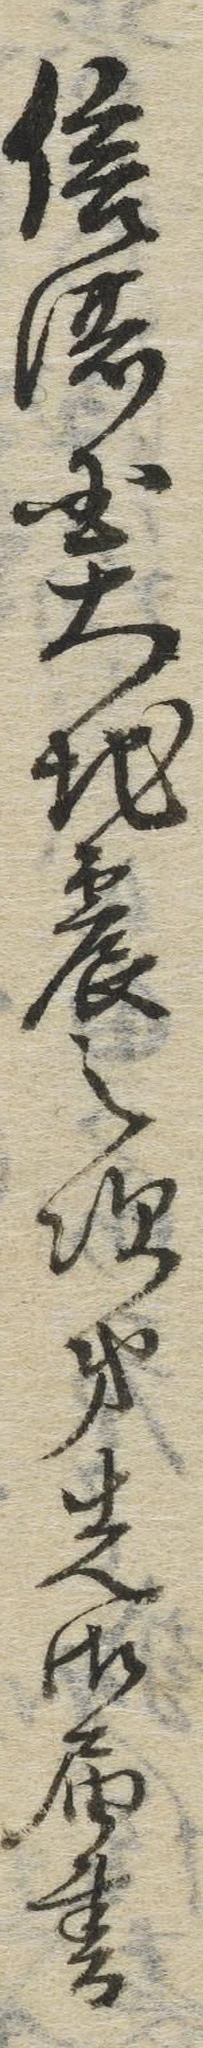信濃国大地震之次第先御届書
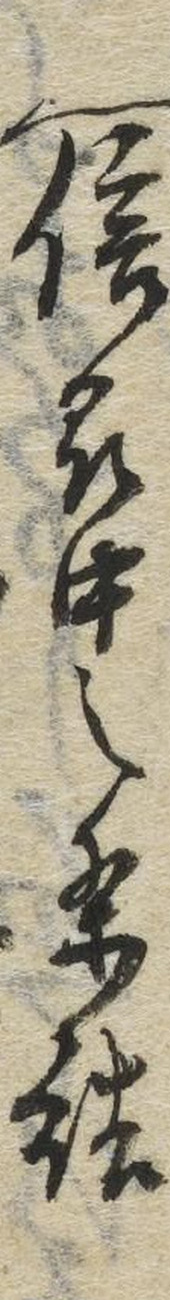信州中之条詰
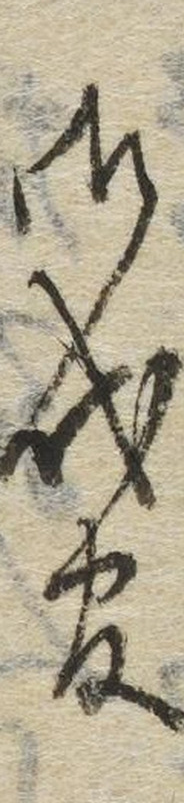御代官
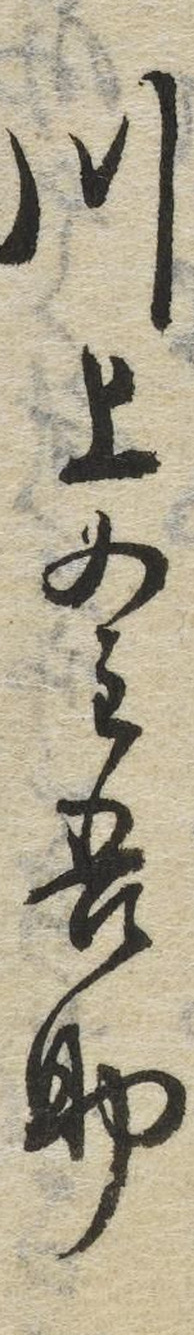川上金吾助
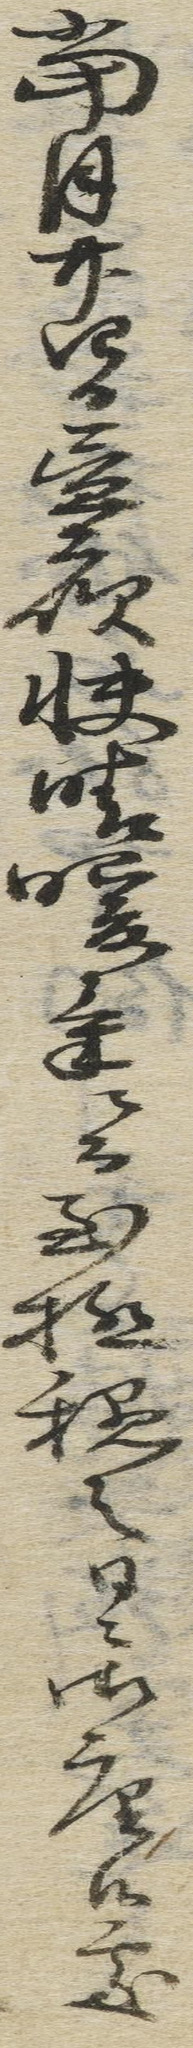当月廿四日昼夜快晴暖気二而至極穏之日二御座候処
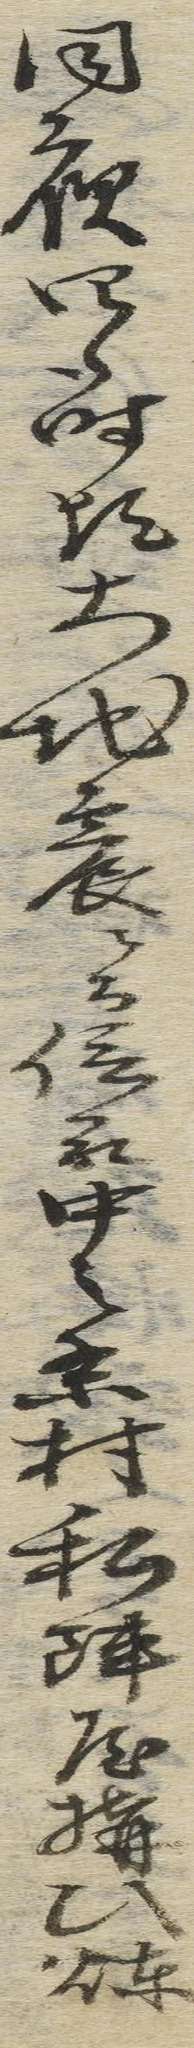同夜四ッ時頃大地震二而信州中之条村私陣屋構ひ練
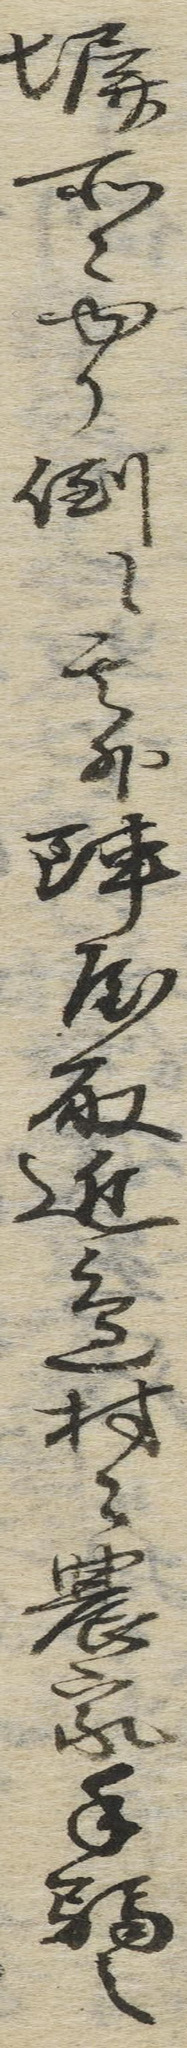塀所々ゆり倒し其外陣屋取近辺村々農家手弱之
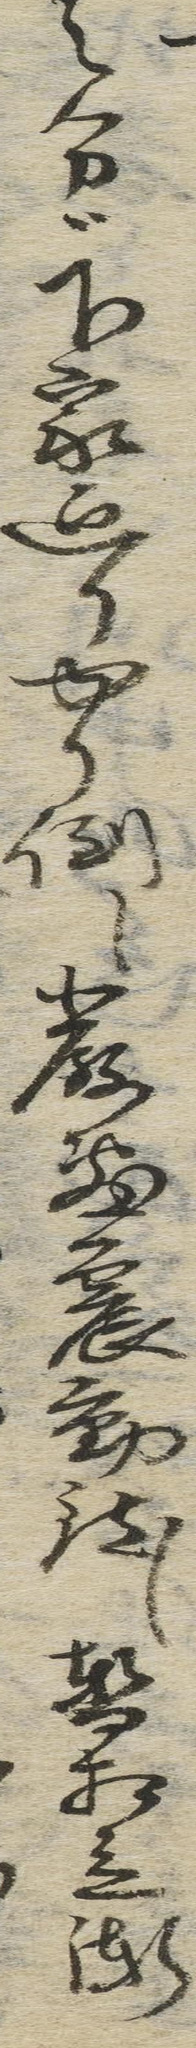分ハ下家廻りゆり倒し厳敷震動致し暫相立漸
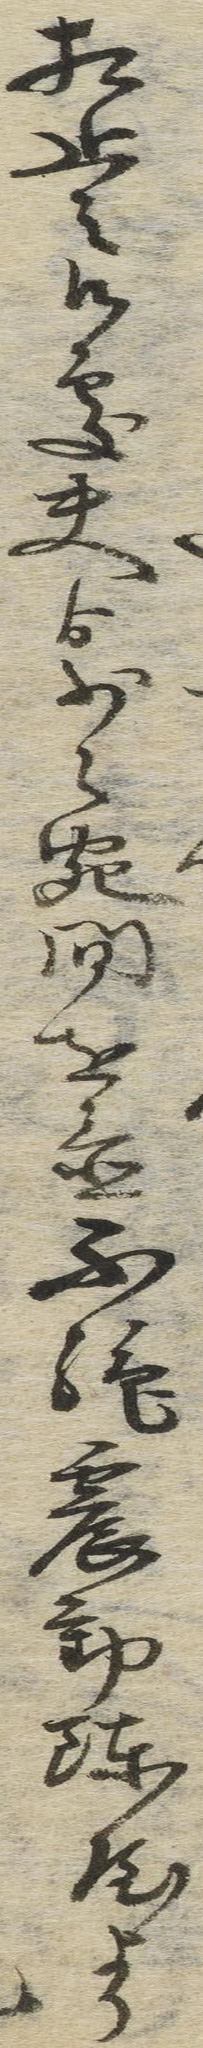相止之候処夫ゟ少々宛間を置不絶震動陣屋より
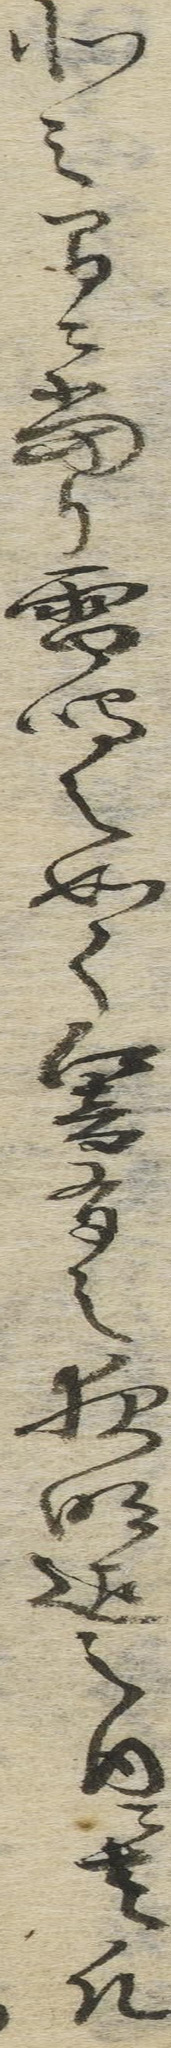北之方二当り雷鳴之如く響有之夜明ヶ迄之内二は凡
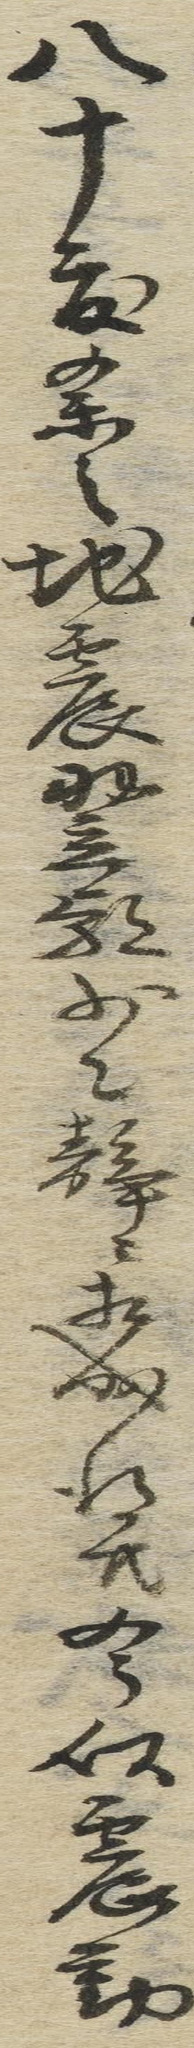八十度余之地震翌朝少々静二相成候得共今以震動

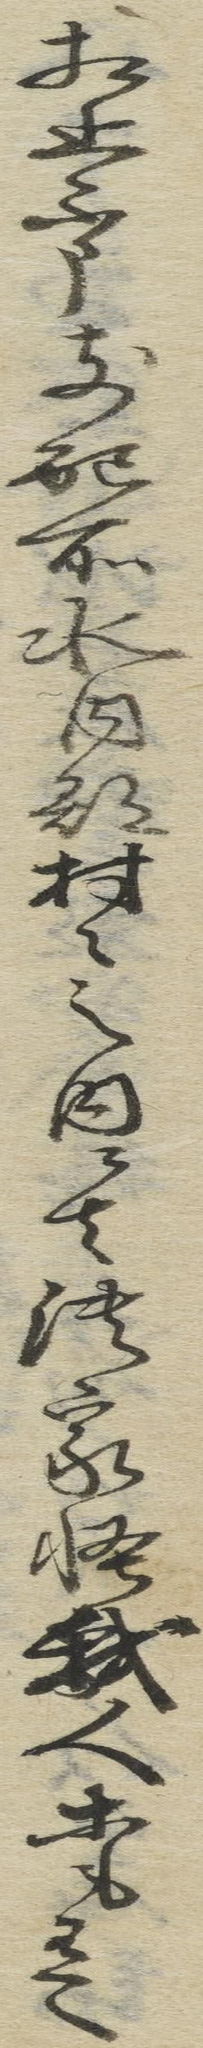相止不申支配所水内郡村々之内二は潰家怪我人等も有之
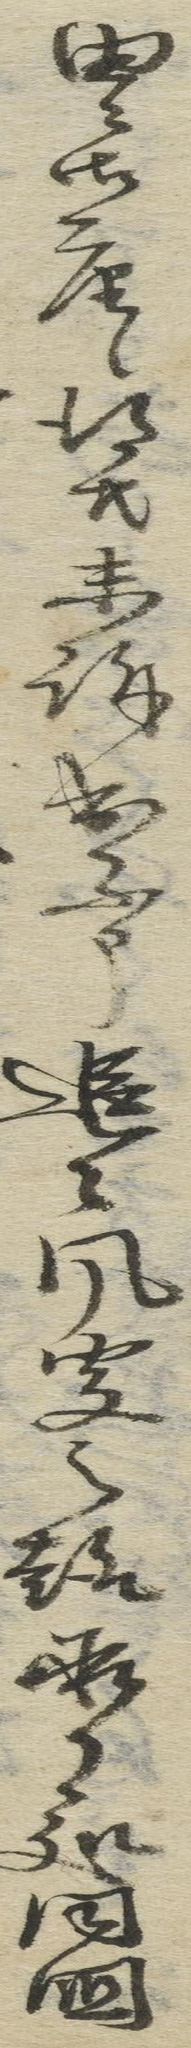由二御座候得共未訴出不申追々風聞之趣承候処同国
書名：信濃越後　地震書留
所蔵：東京大学地震研究所図書室 Earthquake Research Institute Library, The University of Tokyo, JAPAN
